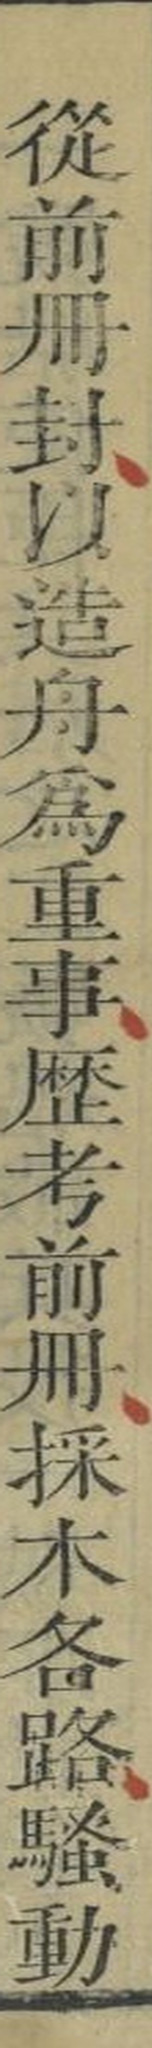從前冊封以造舟爲重事歴考前冊採木各路騷動
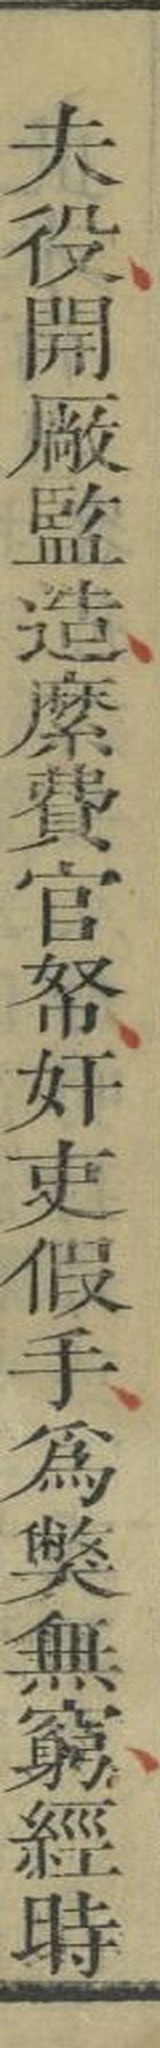夫役開厰監造縻費官帑奸吏假手爲獘無窮經時
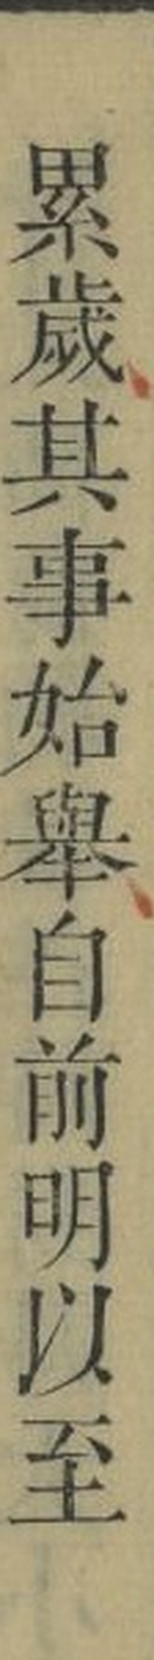累歲其事始舉自前明以至
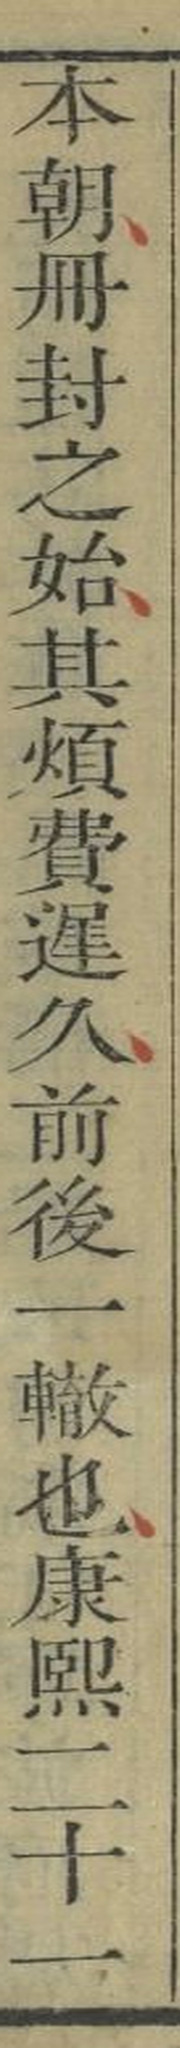本朝冊封之始其煩費遲久前後一轍也康熙二十一
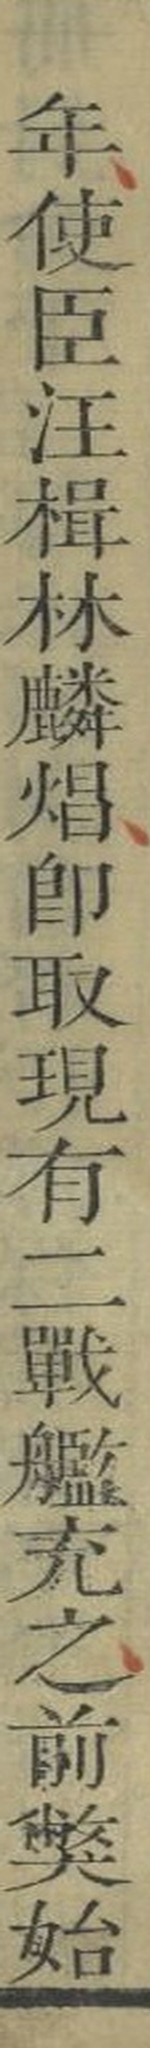年使臣汪楫林麟焻卽取現有二戰艦充之前獘始
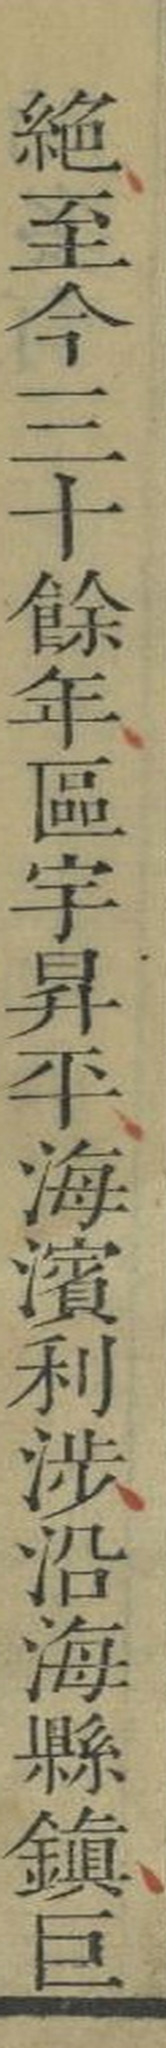絶至今三十餘年區宇昇平海濱利涉沿海縣鎭巨

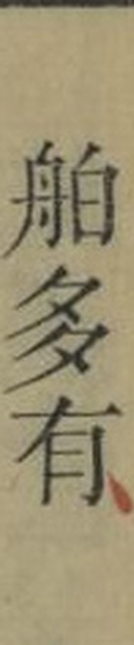舶多有
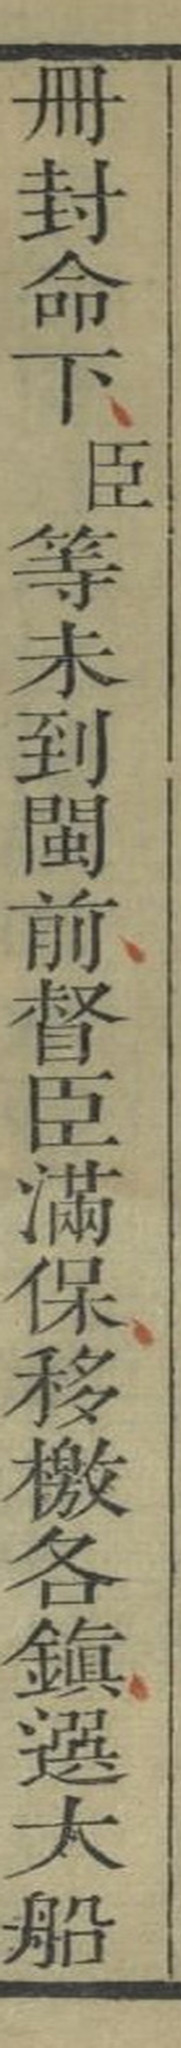冊封命下臣等未到閩前督臣滿保移檄各鎭選大船
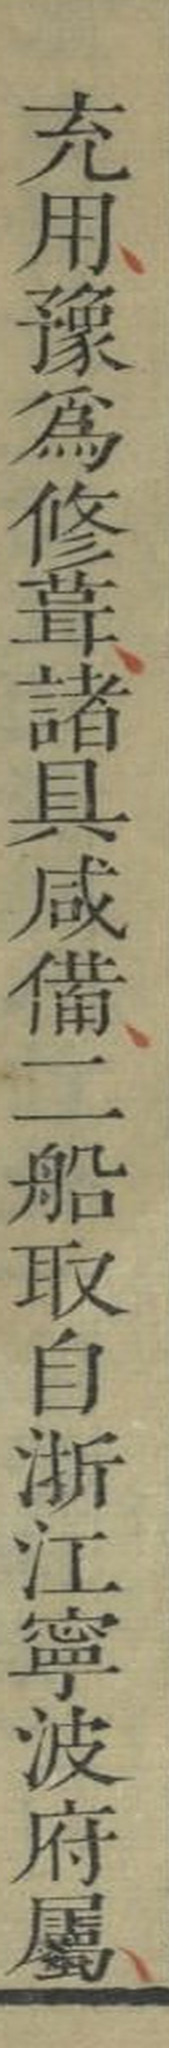充用豫爲修葺諸具咸備二船取自浙江寧波府屬
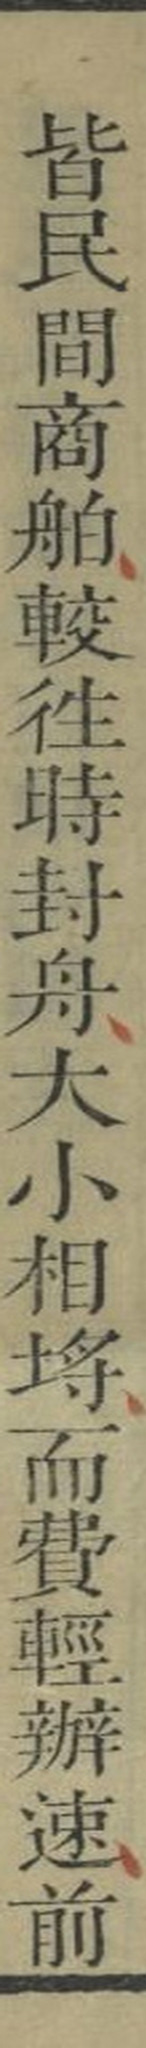皆民間商舶較徃時封舟大小相埓而費輕辦速前
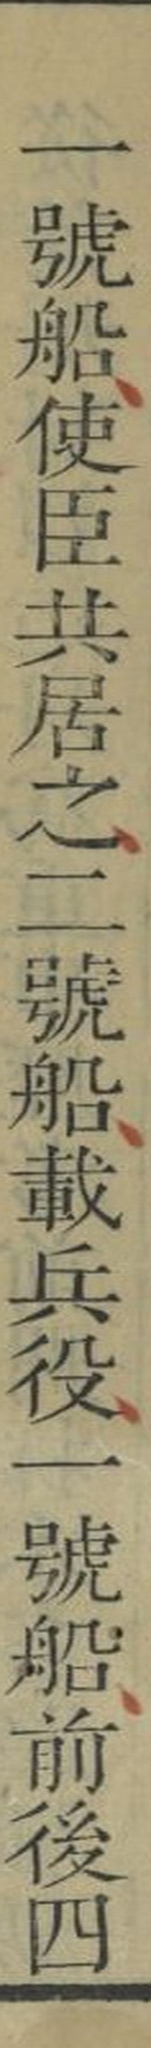一號船使臣共居之二號船載兵役一號船前後四
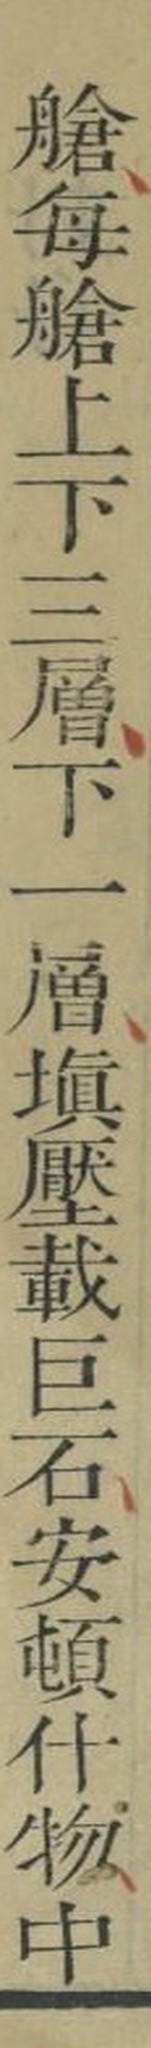艙每艙上下三層下一層塡壓載巨石安頓什物中
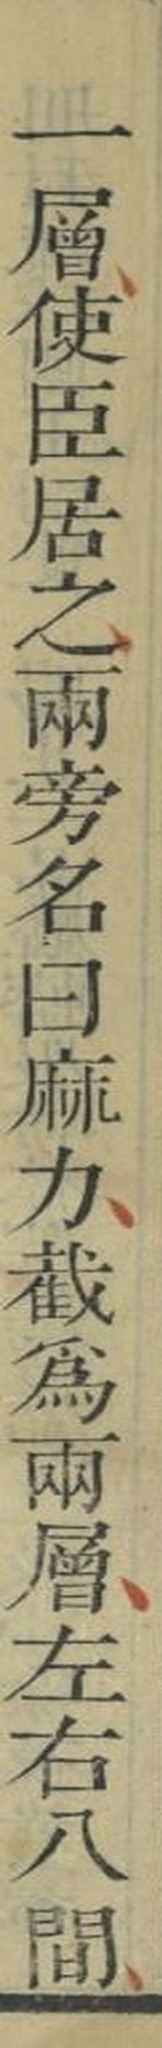一層使臣居之兩旁名曰麻力截爲兩層左右八間
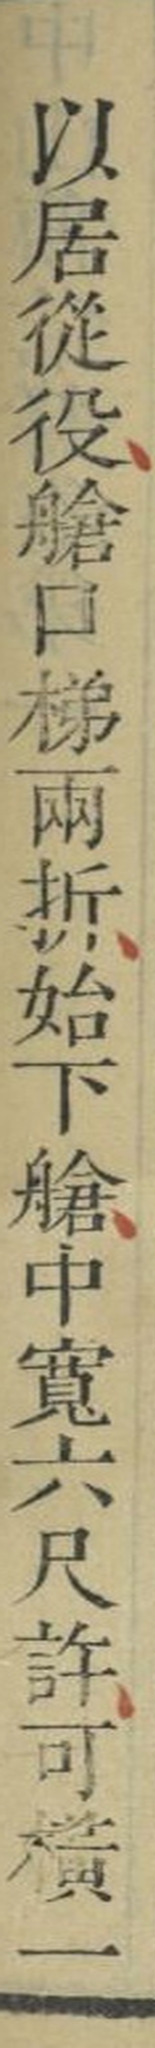以居從役艙口梯兩折始下艙中寬六尺許可橫一
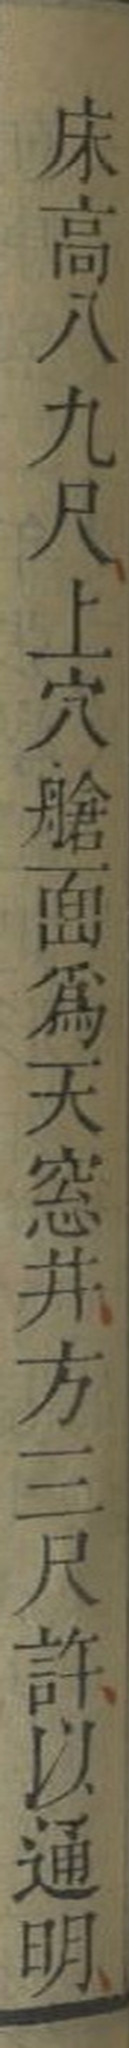床高八九尺上穴艙面爲天窓井方三尺許以通明
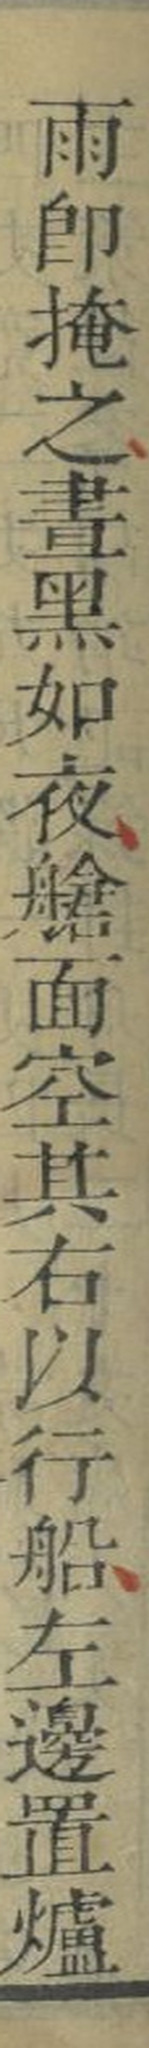雨卽掩之晝黑如夜艙面空其右以行船左邊置爐
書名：中山伝信録 巻一、巻二
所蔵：University of the Ryukyus Library
